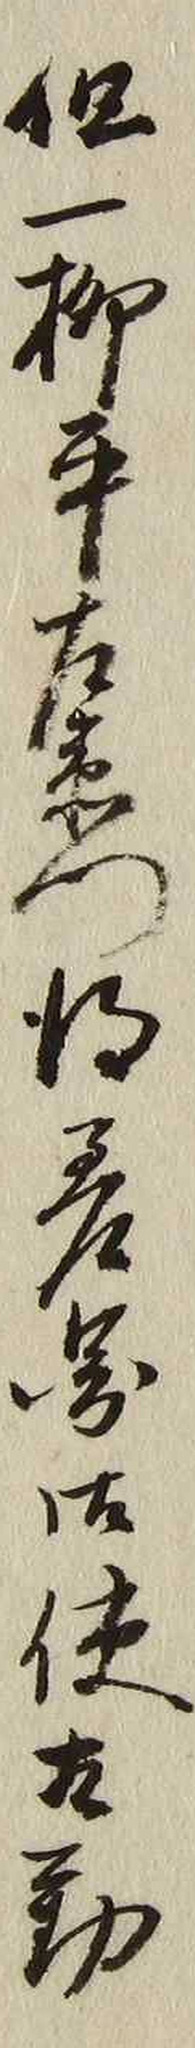但一柳平左衛門得差図御使相勤
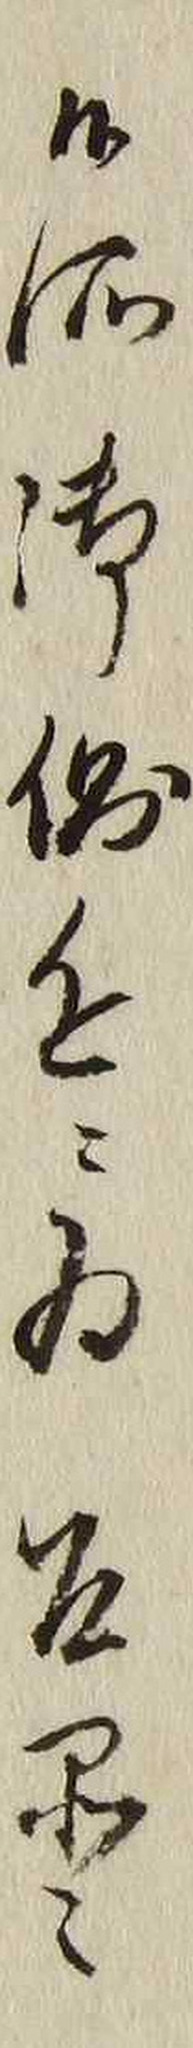候所御側近ニ為召品々
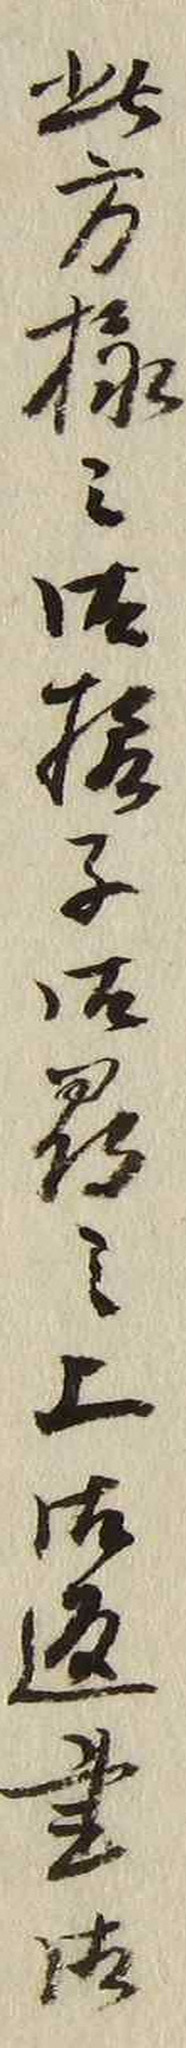此方様之御様子御尋之上御返書御
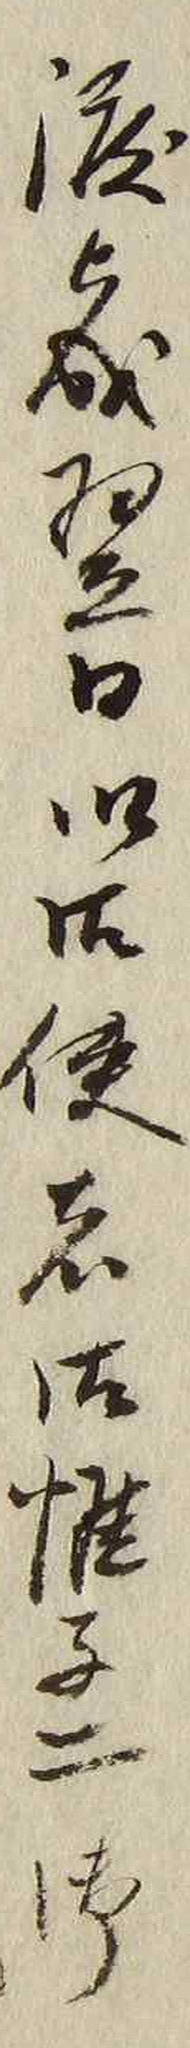渡被成翌日以御使者御帷子二御
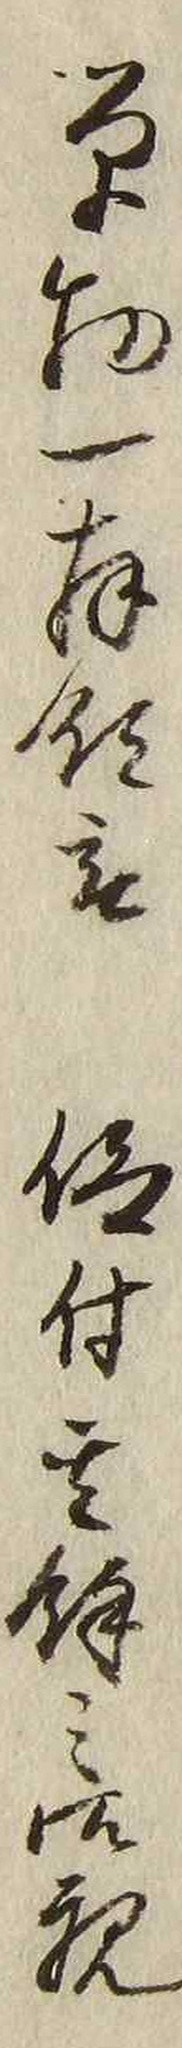単物一拝領被仰付其余之御親

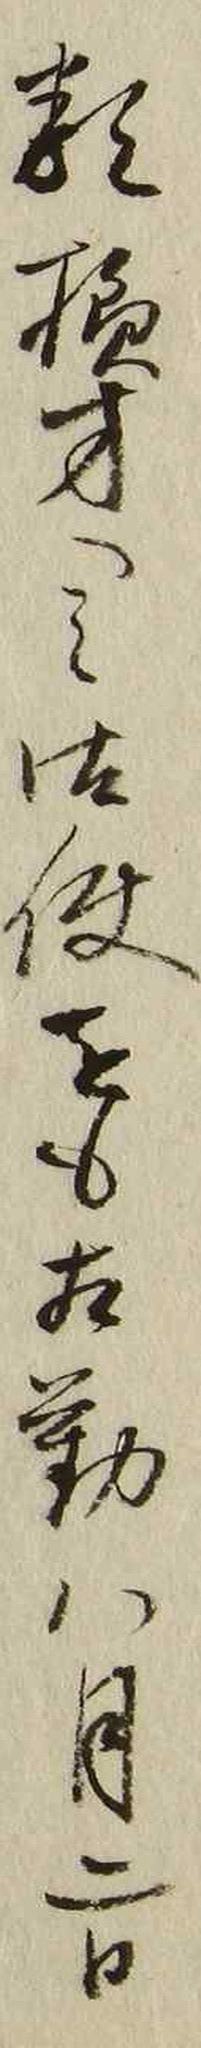類様方へ之御使をも相勤八月二日
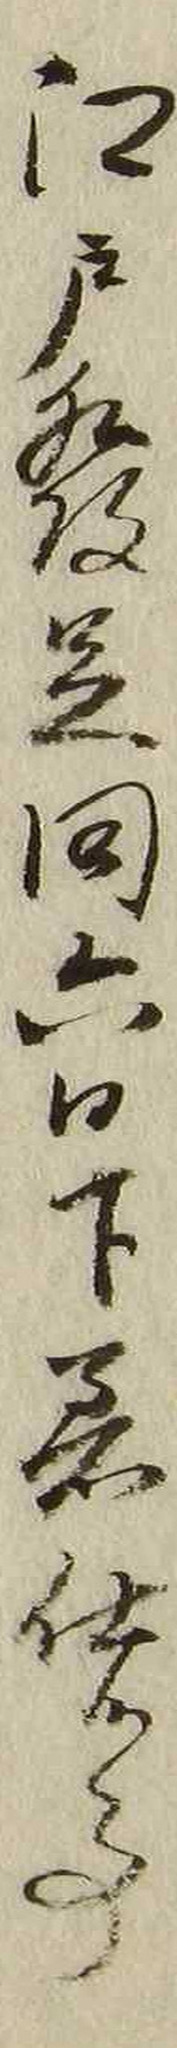江戸発足同六日下着仕候事
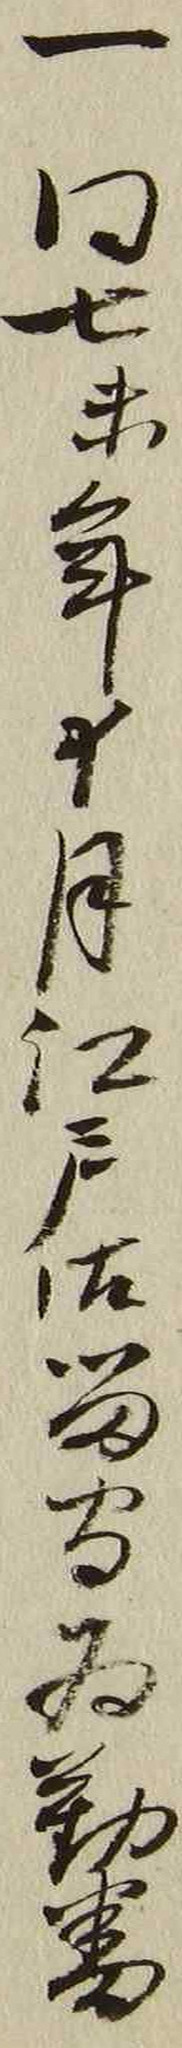一同七未年十月江戸御留守為勤番
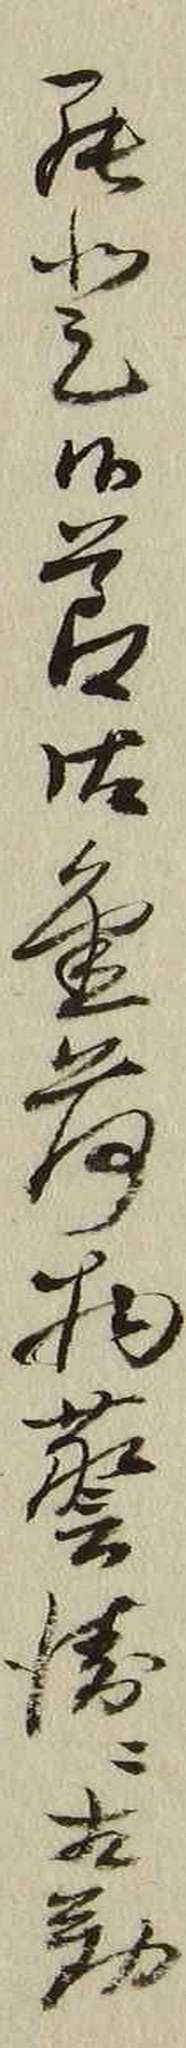罷登候節御金荷物警衛ニ相勤
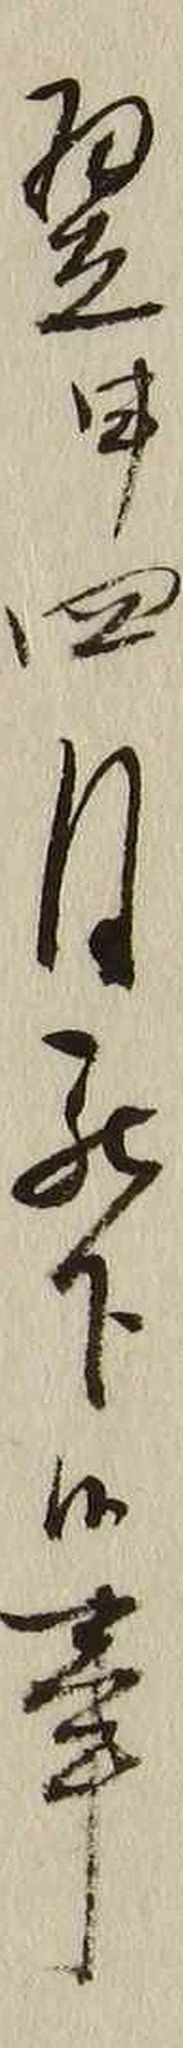翌申四月罷下候事
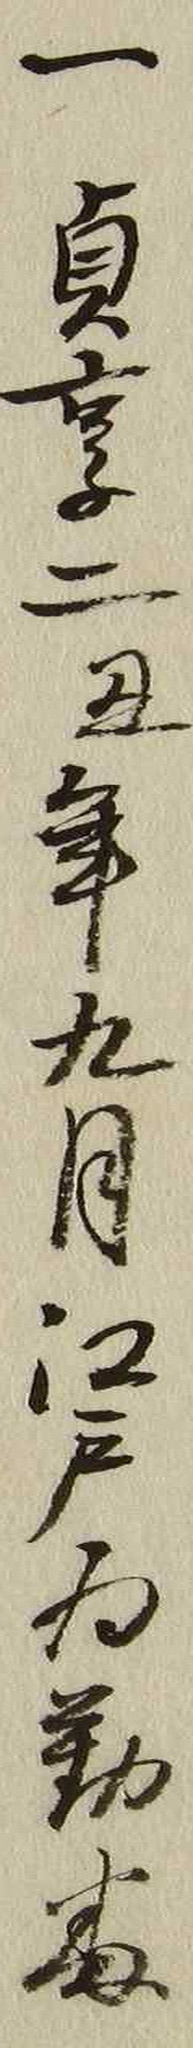一貞享二丑年九月江戸為勤番
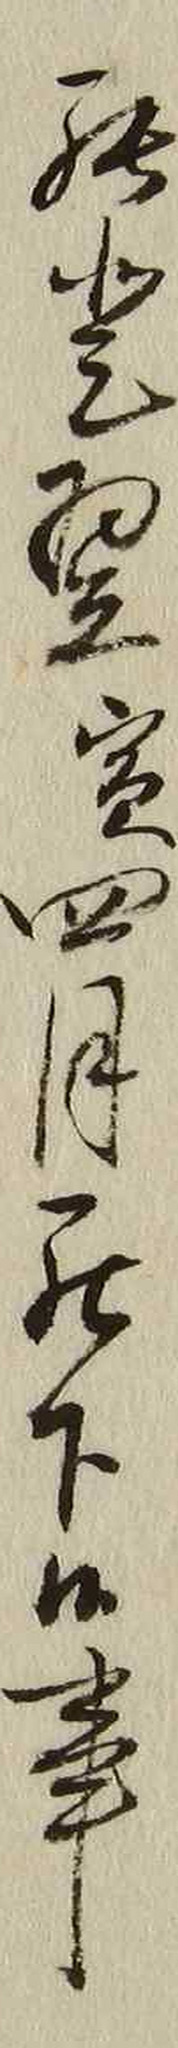罷登翌寅四月罷下候事
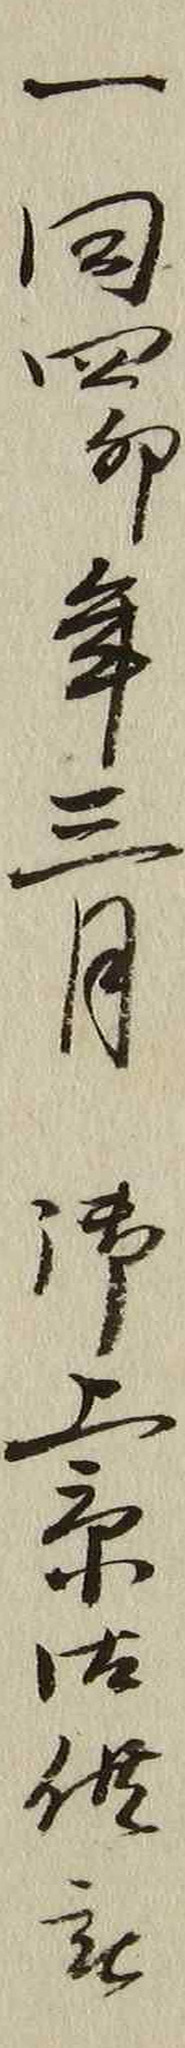一同四卯年三月御上京御供被
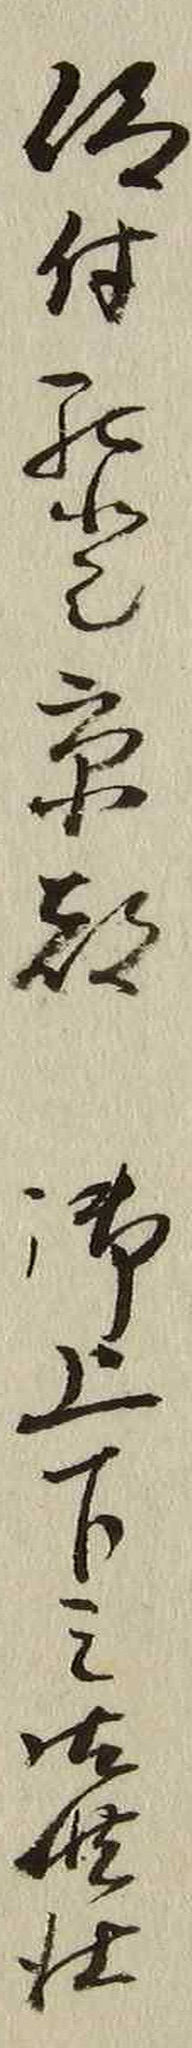仰付罷登京都御上下之御供仕
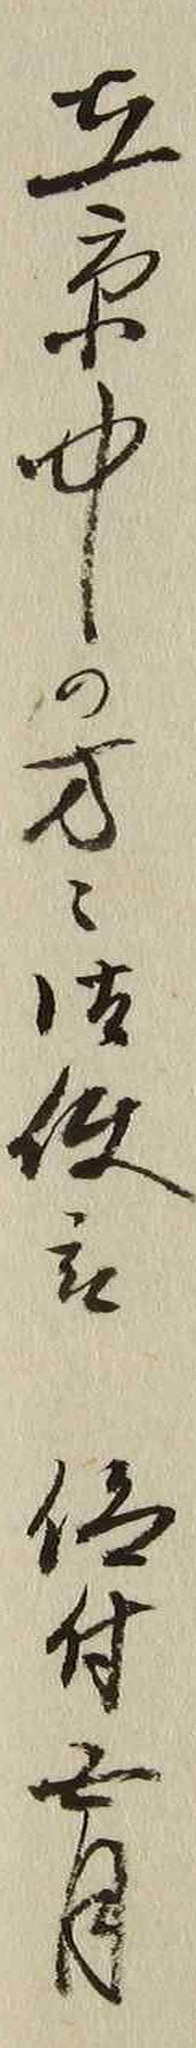在京中の方々御使被仰付五月
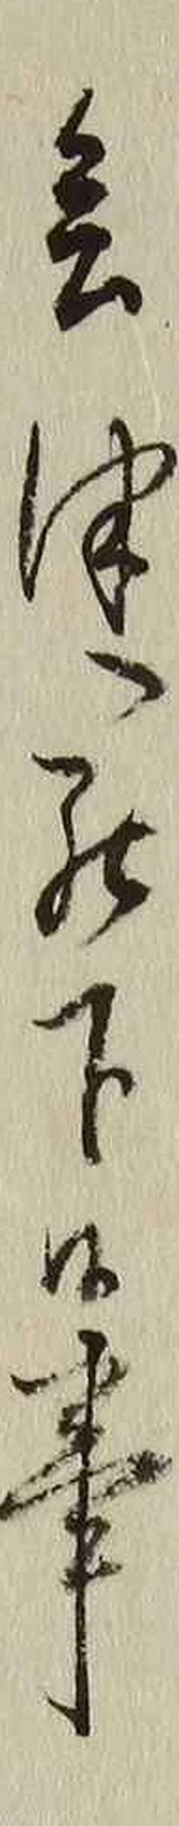会津へ罷下候事
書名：諸士系譜　巻之356　す之部6
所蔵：会津若松市立会津図書館
